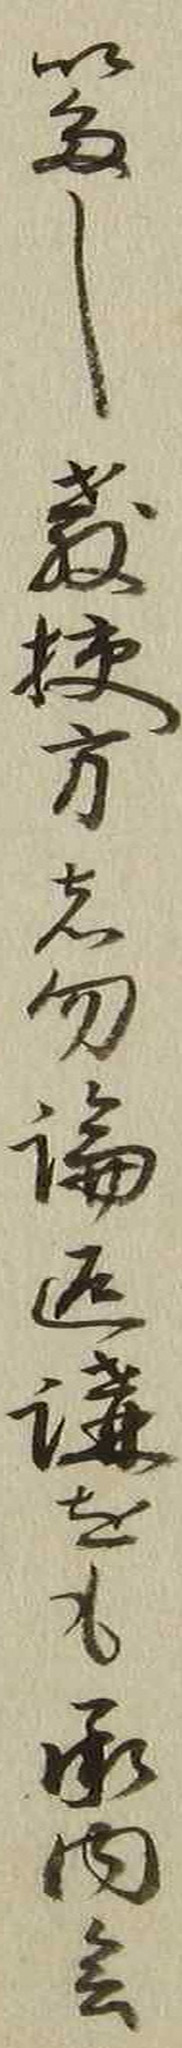いたし教校方は勿論返講をも承内会
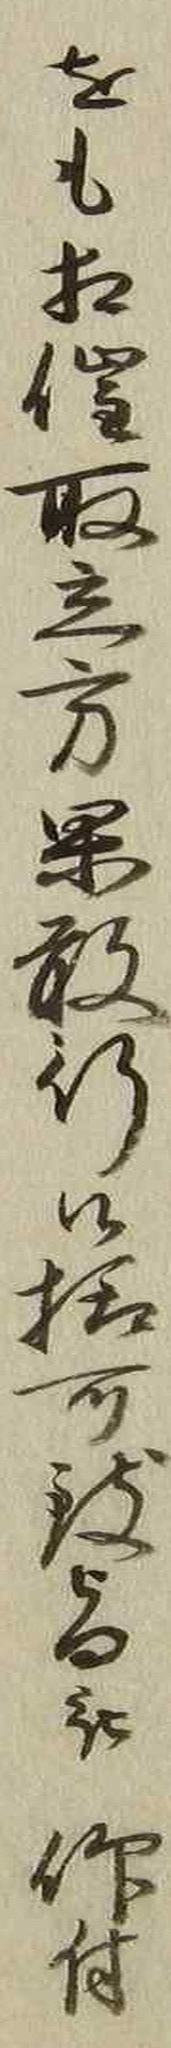をも相催取立方果敢行候様可致旨被仰付
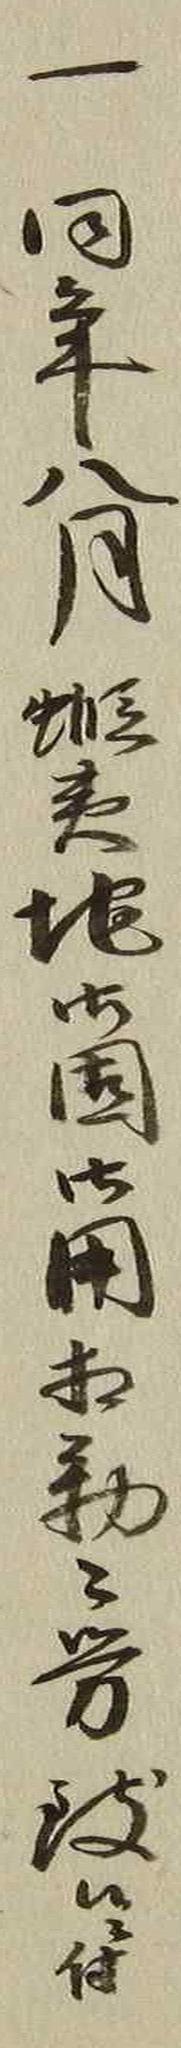一同年八月蝦夷地御国御用相勤々労致侯に付
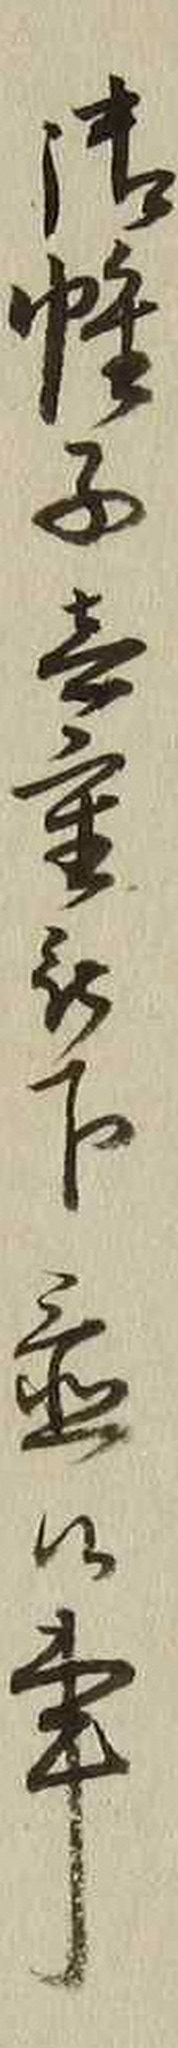御帷子壱重被下置候事
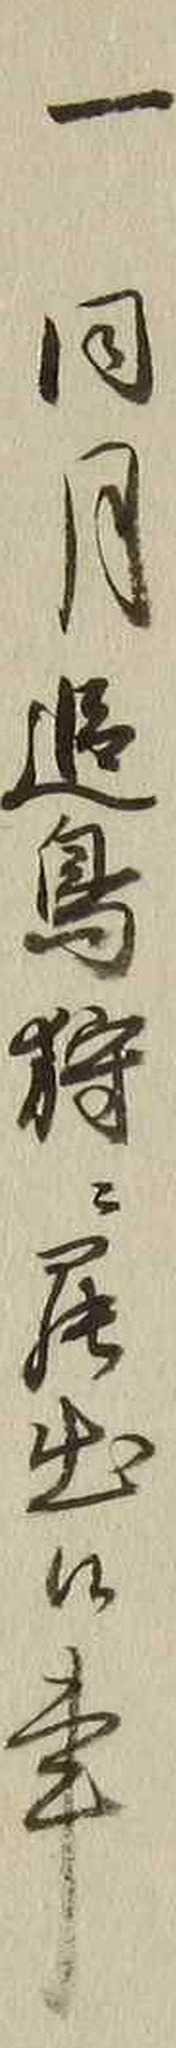一同月追鳥狩に罷出候事
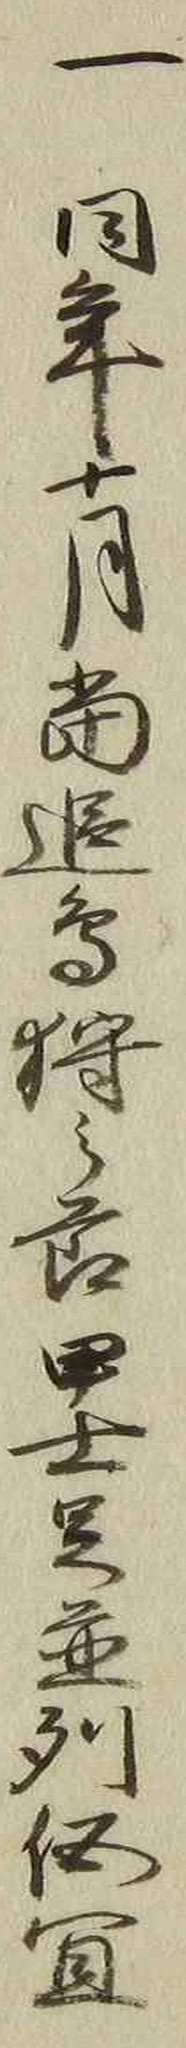一同年十月当追鳥狩之節甲士足並列伍宜
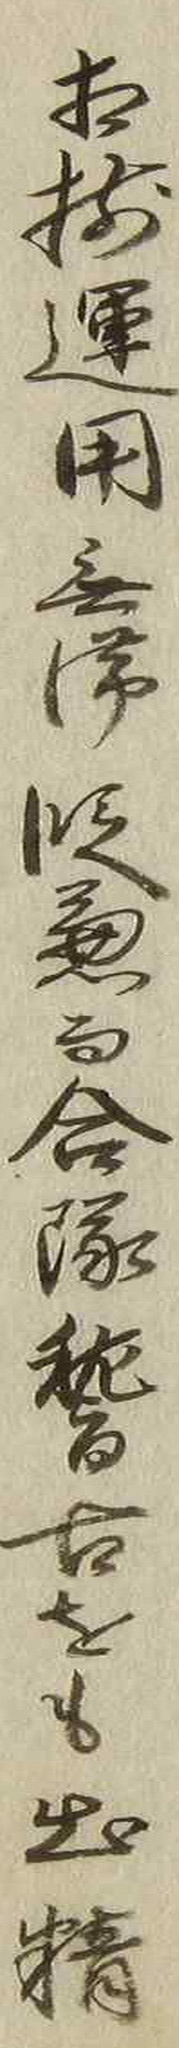相揃運用無滞段兼而合隊稽古をも出精
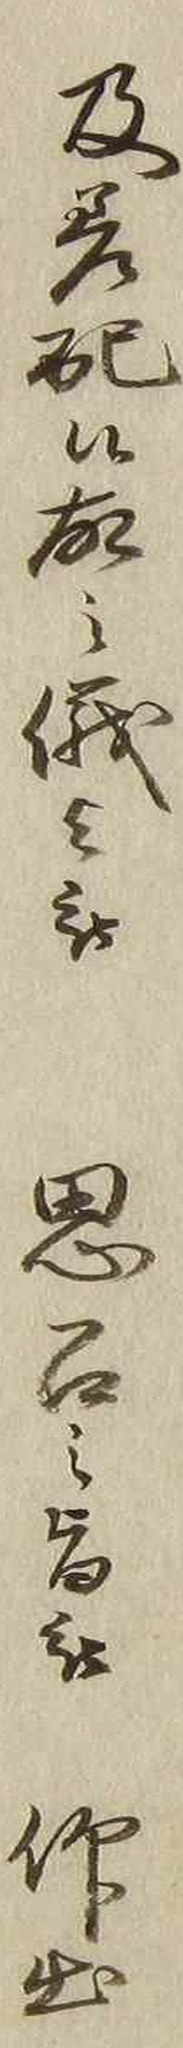及差配候故之儀と被思召之旨被仰出
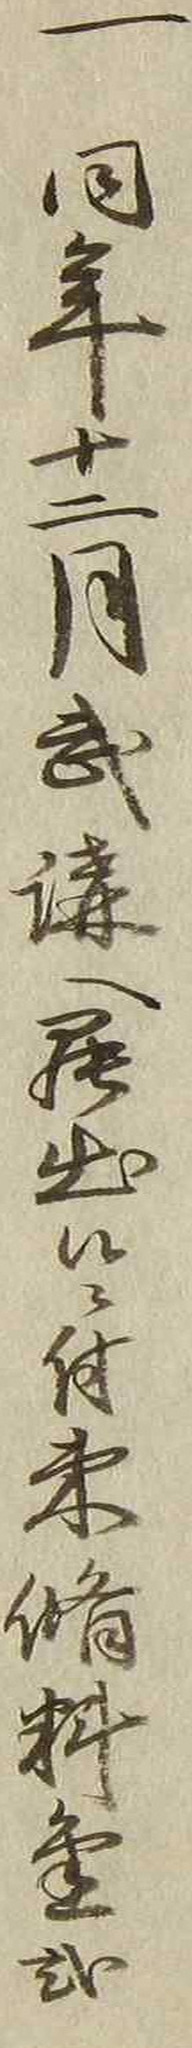一同年十二月武講へ罷出候に付束脩料金弐
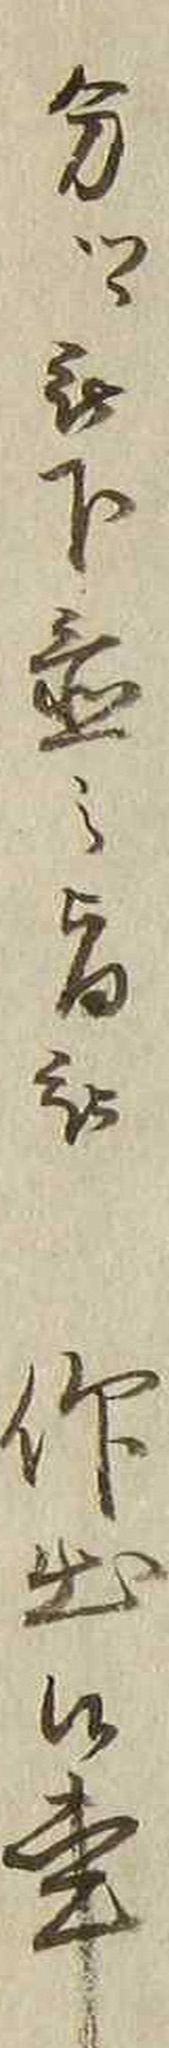分つヽ被下置之旨被仰出候事
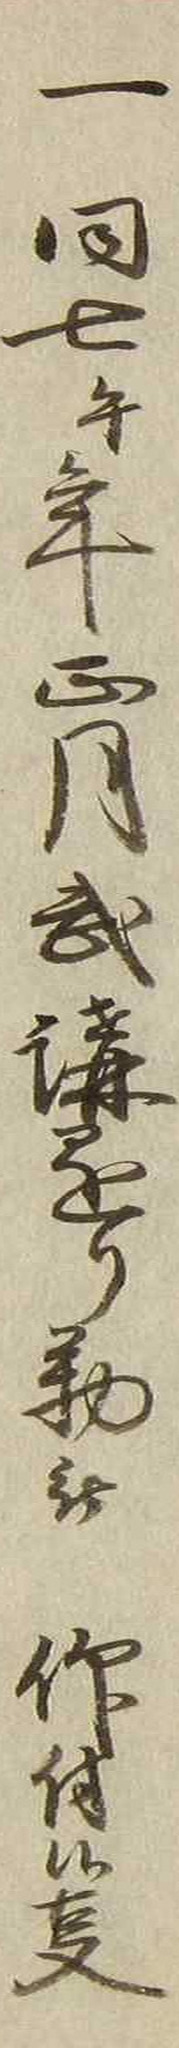一同七午年正月武講懸り勤被仰付候事
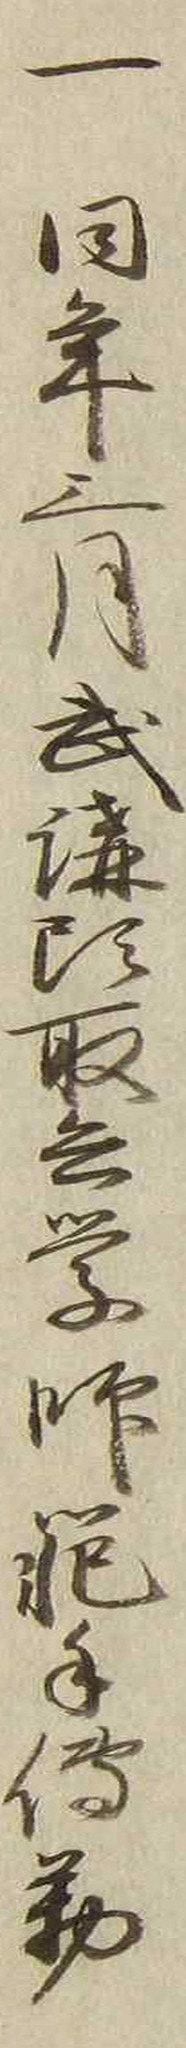一同年三月武講頭取兵学師範手伝勤

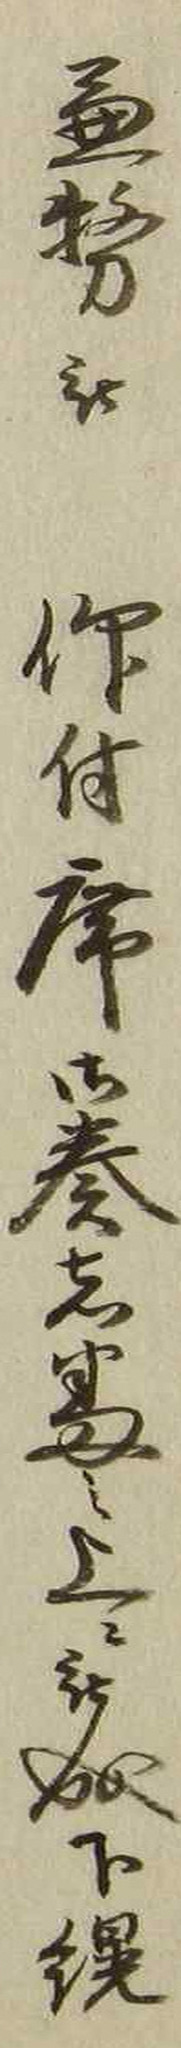兼務被仰付席御奏者番之上に被成下縨
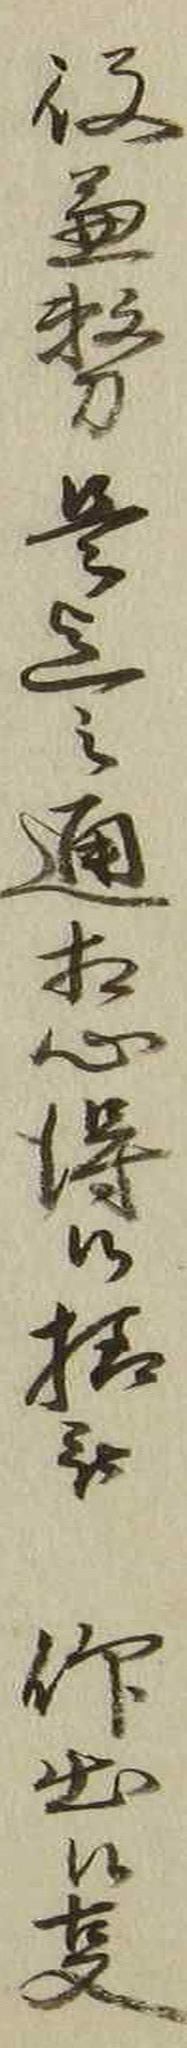役兼務是迄之通相心得候様被仰出候事
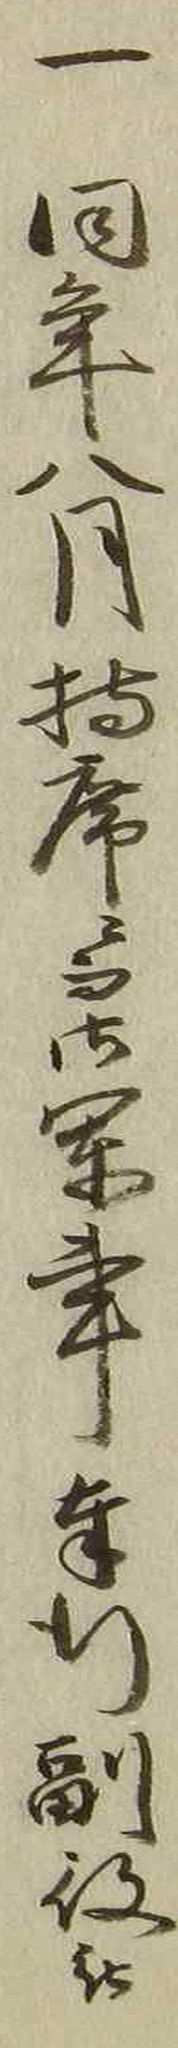一同年八月持席に而御軍事奉行副役被
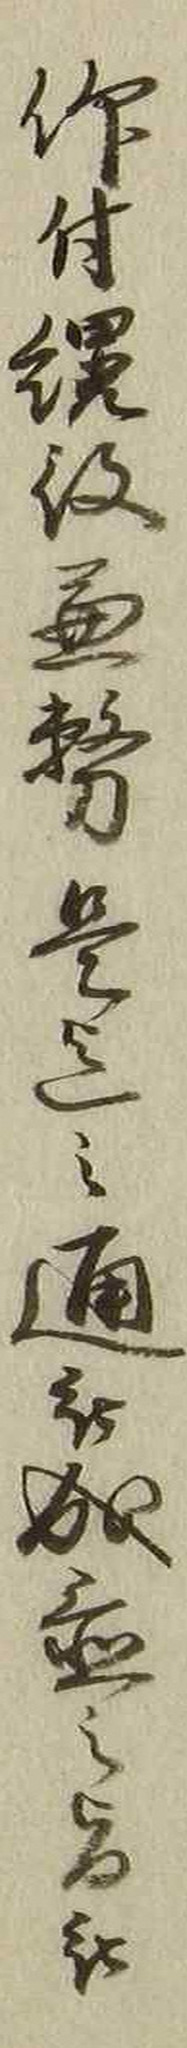仰付縨役兼務是迄之通被成置之旨被
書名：諸士系譜　巻之133　た之部9
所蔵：会津若松市立会津図書館
